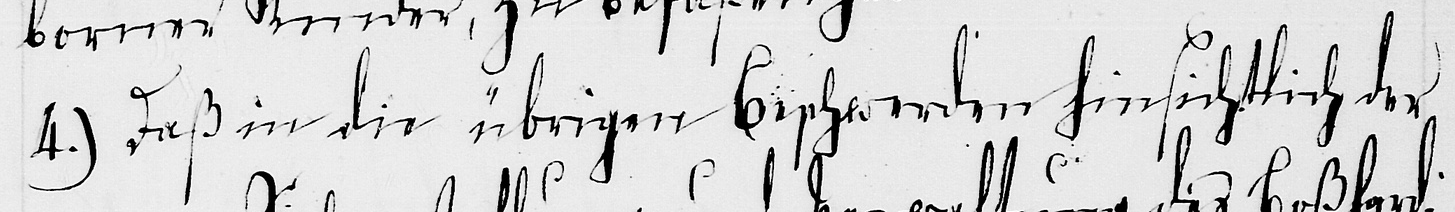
4.) Daß in die übrigen Beschwerden hinsichtlich der
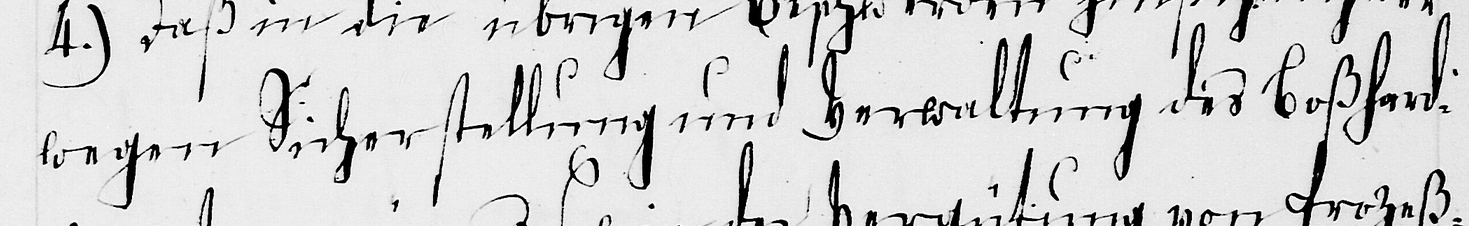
wegen Sicherstellung und Verwaltung des Boßhard¬
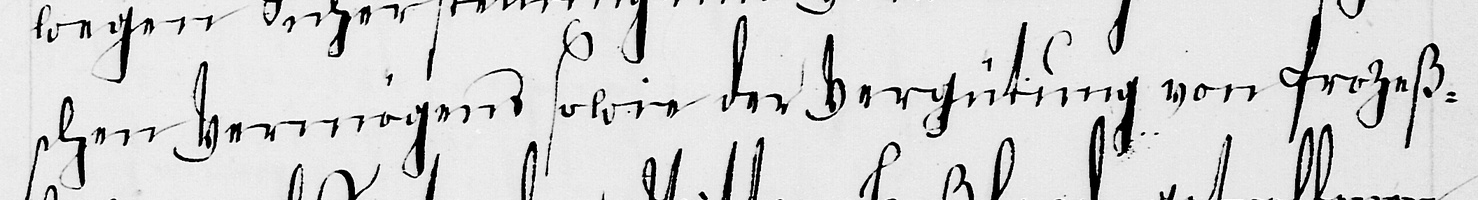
schen Vermögens sowie der Vergütung von Prozeß¬
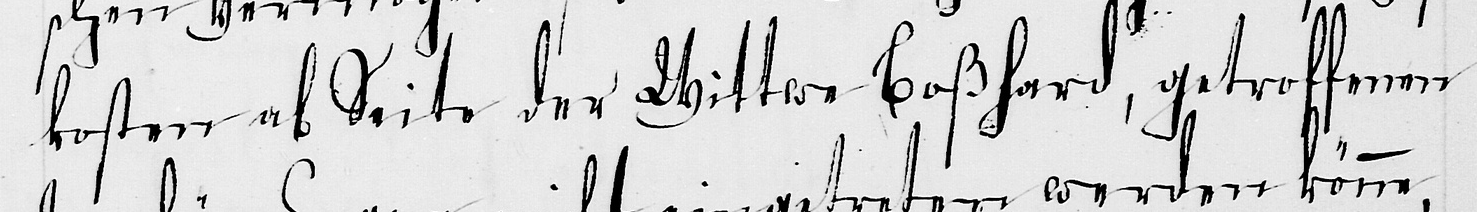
kosten ab Seite der Wittwe Boßhard, getroffenen
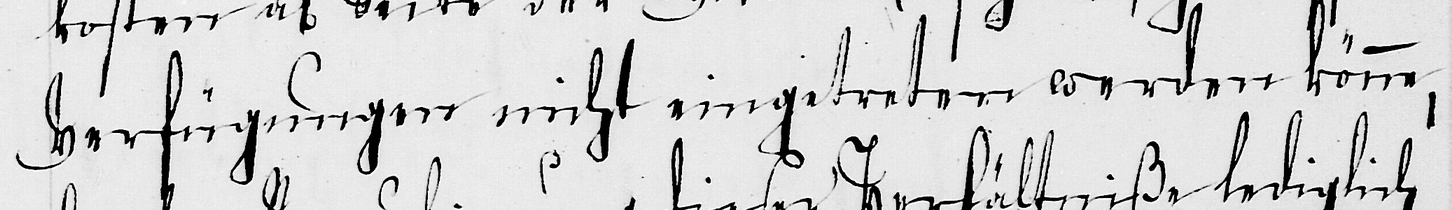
Verfügungen nicht eingetreten werden könne,
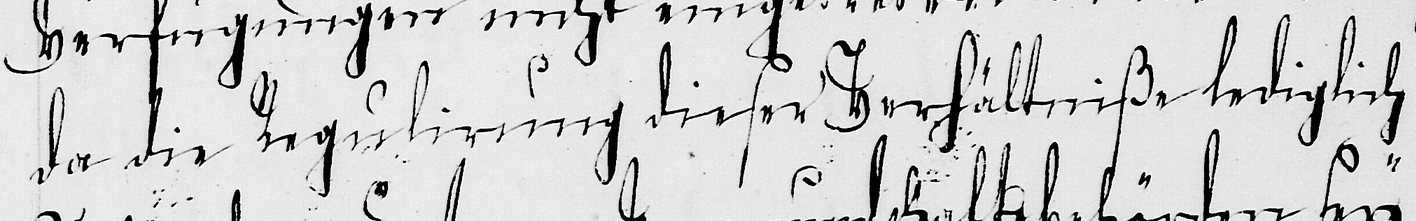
da die Regulirung dieser Verhältniße ledigli¬
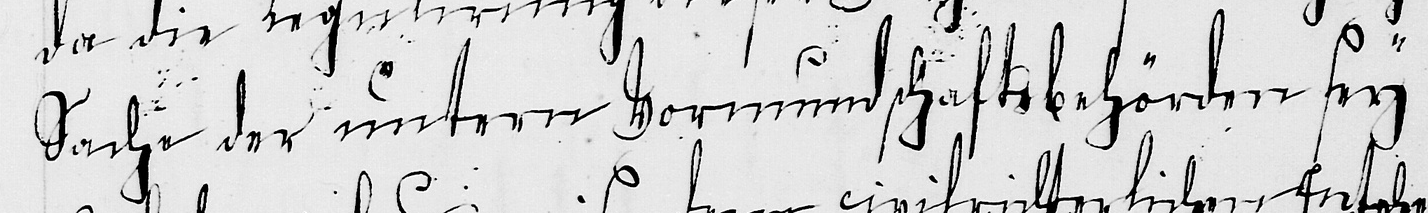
Sache der untern Vormundschaftbehörden sey
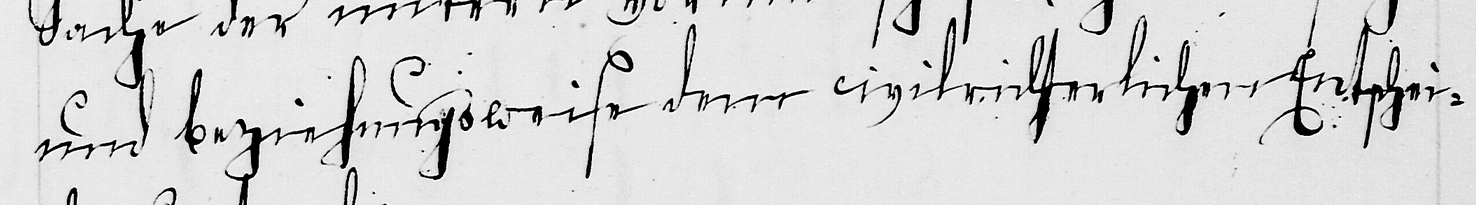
und beziehungsweise dem civilrichterlichen Entschei¬
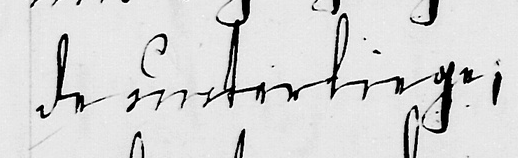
de unterliege;
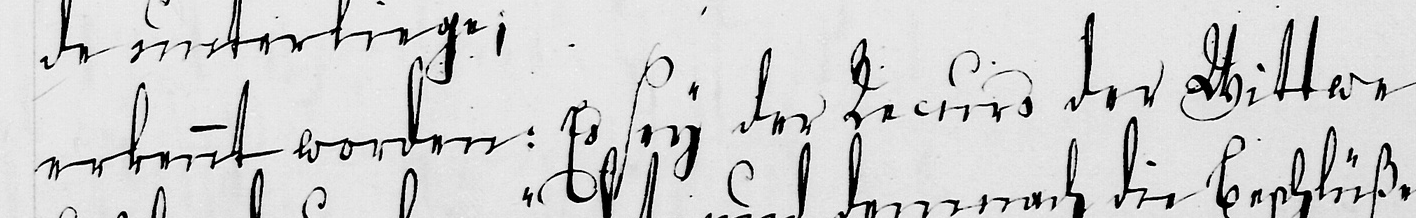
erkennt worden: Es sey der Recurs der Wittwe
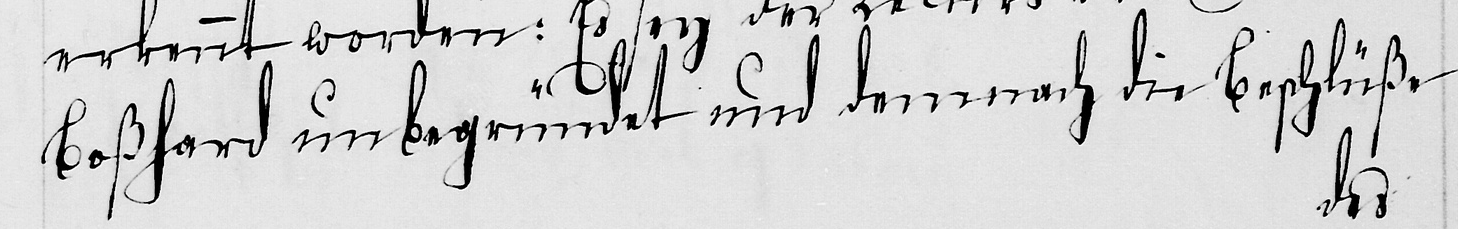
Boßhard unbegründet und demnach die Beschlüße
